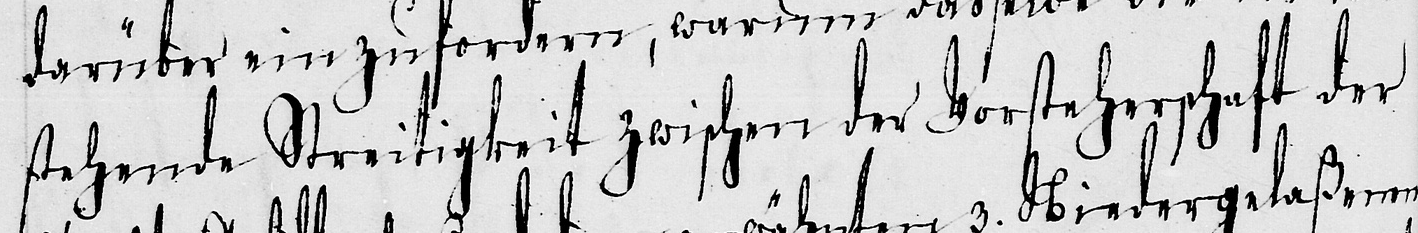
stehende Streitigkeit zwischen der Vorsteherschaft der
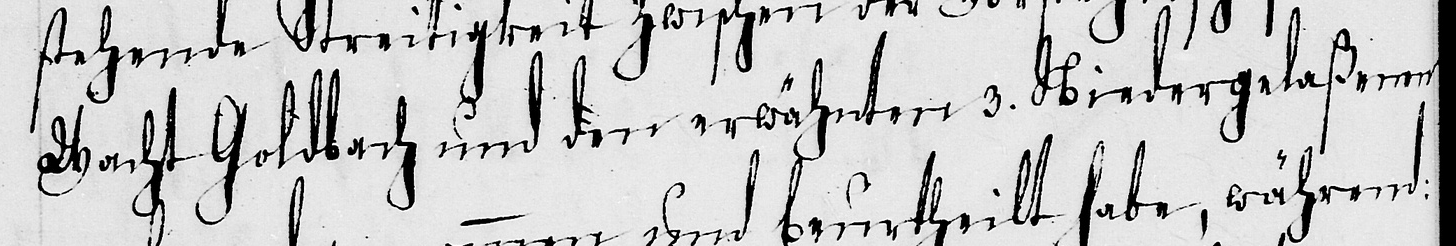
Wacht Goldbach und den erwähnten 3. Niedergelaßenen
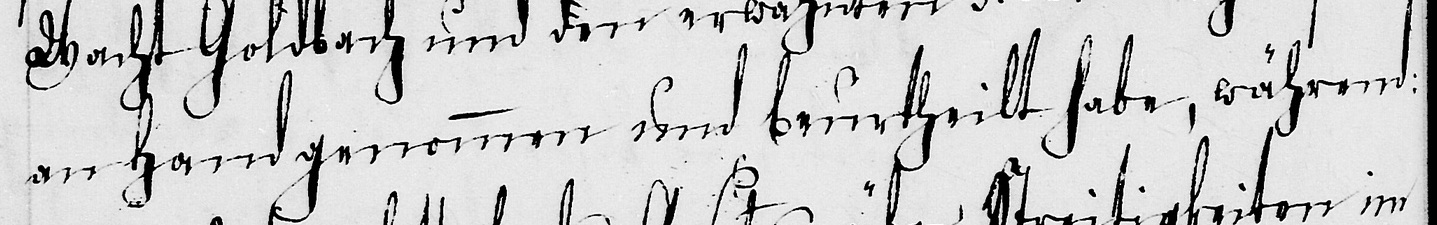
an Hand genommen und beurtheilt habe, während:
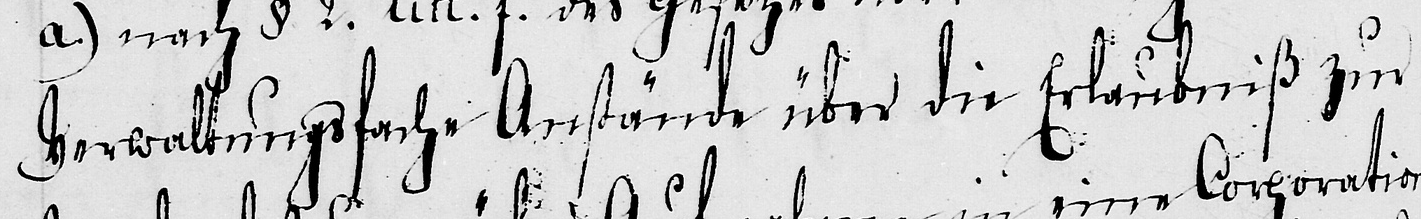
Verwaltungsfache Anstände über die Erlaubniß zur
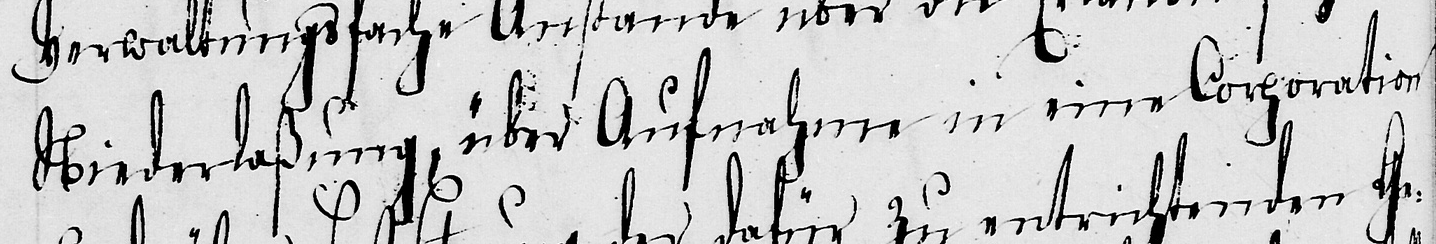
Niederlaßung, über Aufnahme in eine Corporation
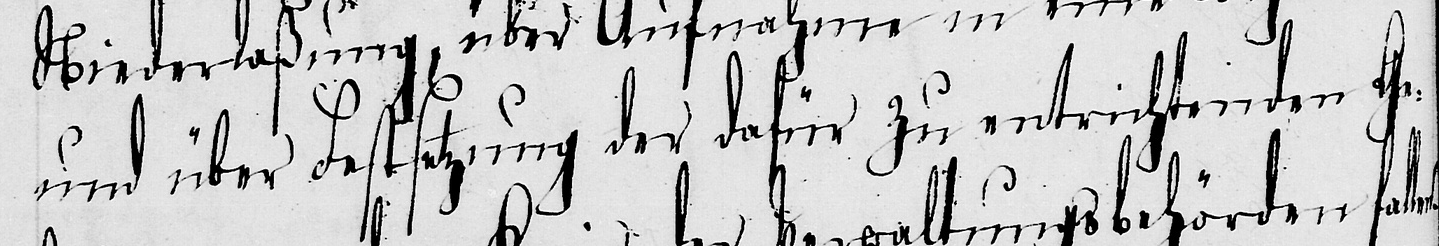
und über Festsetzung der dafür zu entrichtenden Ge¬
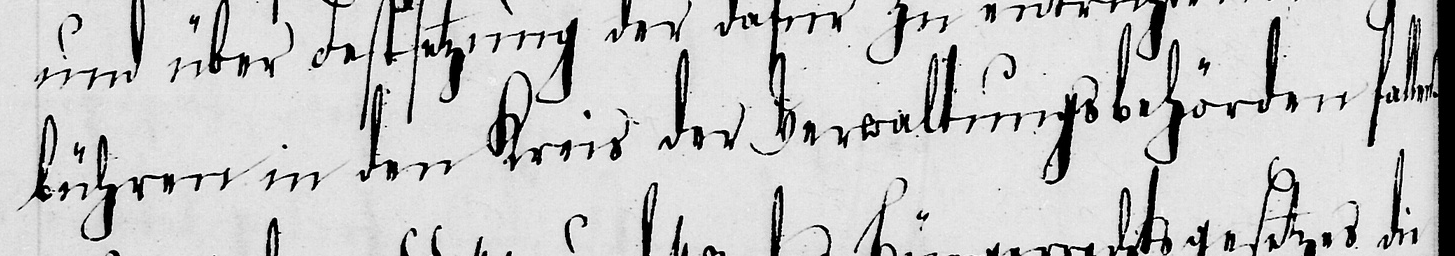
bühren in den Kreis der Verwaltungsbehörden fal¬
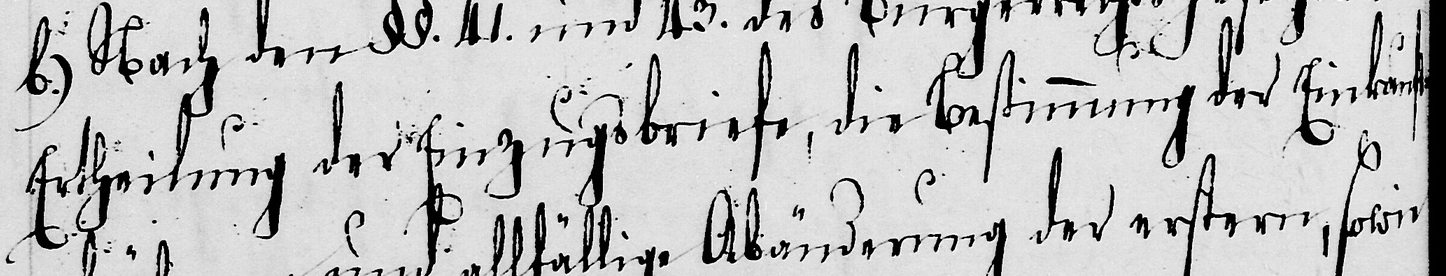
Ertheilung der Einzugsbriefe, die Bestimmung der Einkau¬
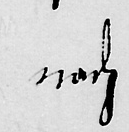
nach
